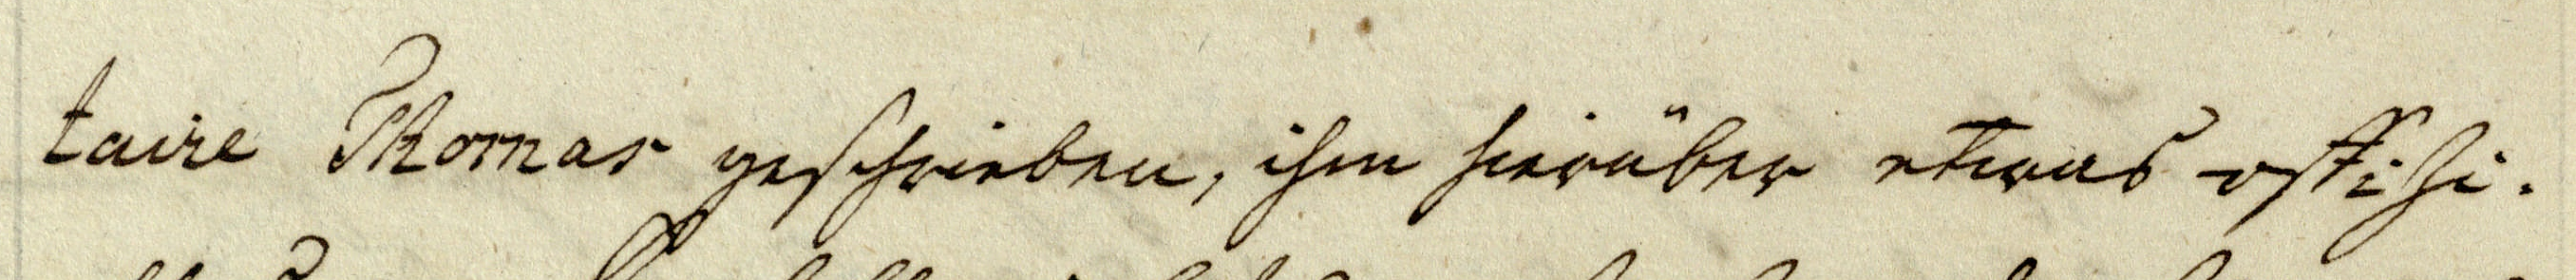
taire Thomas geschrieben, ihm hierüber etwas offizi¬
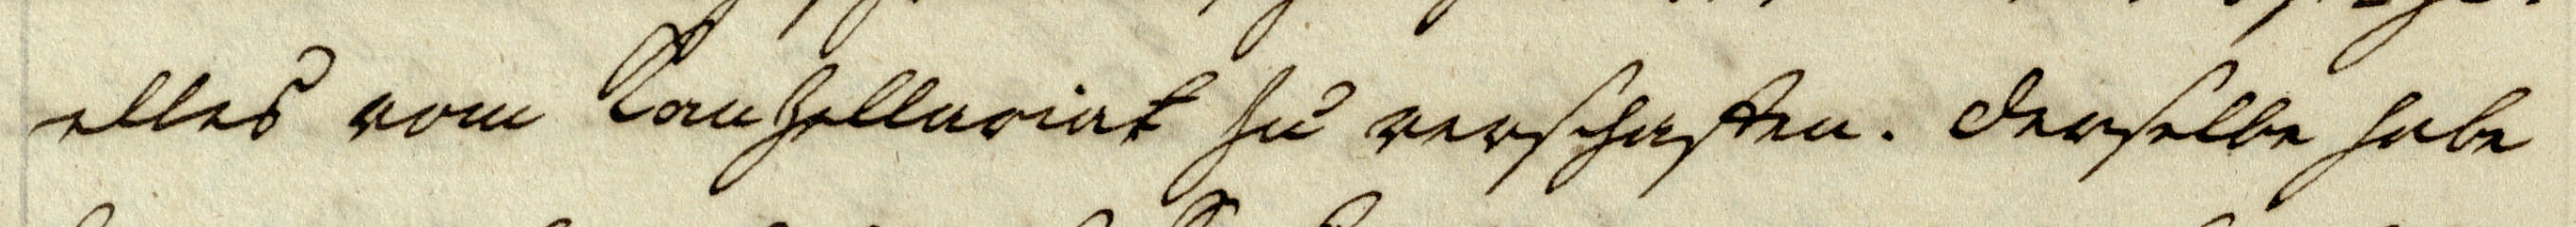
elles vom Kanzellariat zu verschaffen. Derselbe habe
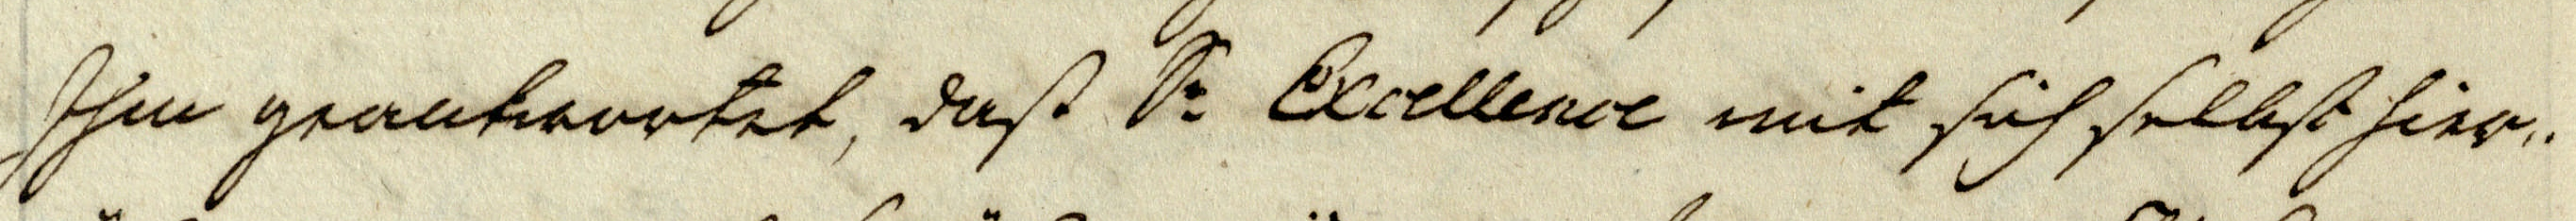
Ihm geantwortet, daß Sr Excellence mit sich selbst hier¬
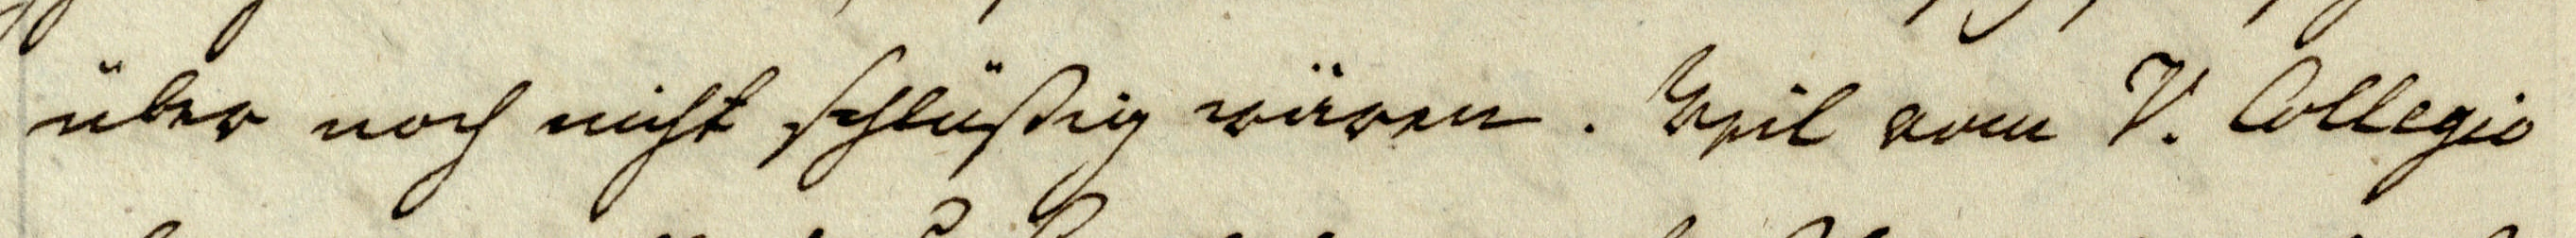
über noch nicht schlüssig wären. Weil vom V. Collegio
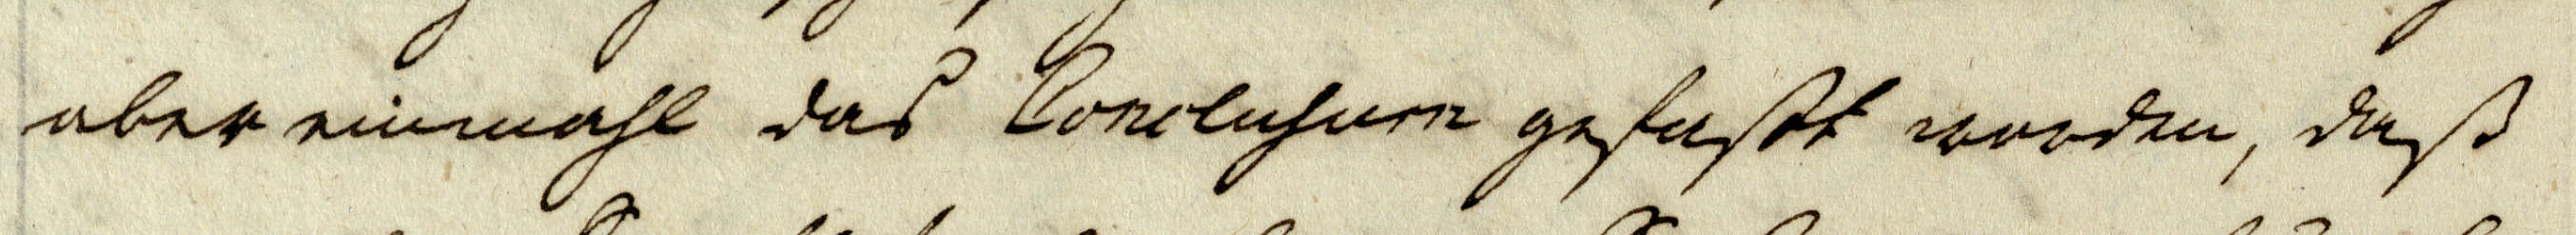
aber einmahl das Conclusum gefaßt worden, daß
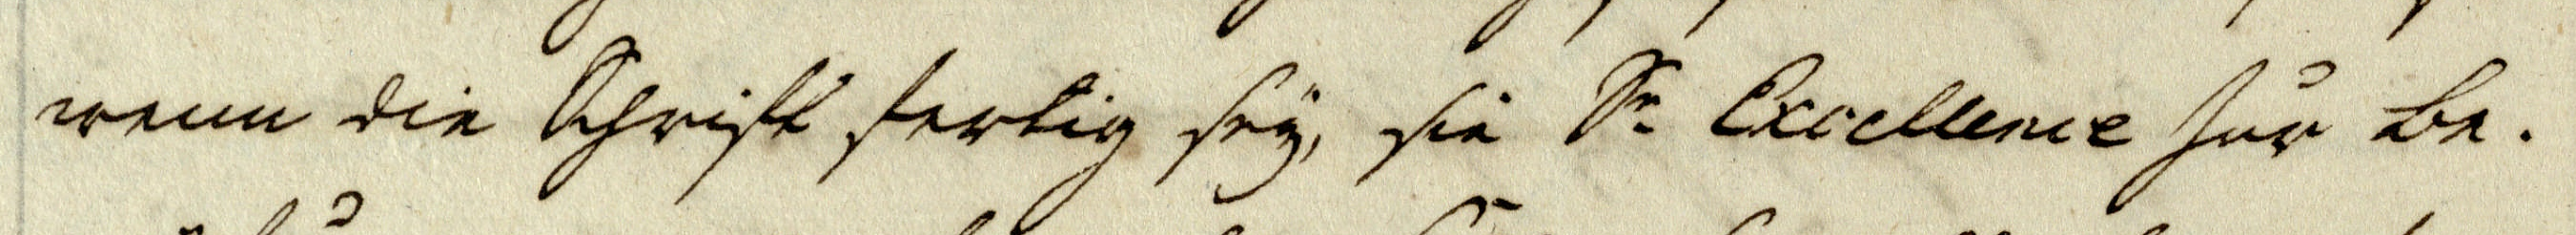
wenn die Schrift fertig seÿ, sie Sr Excellence zur Be¬
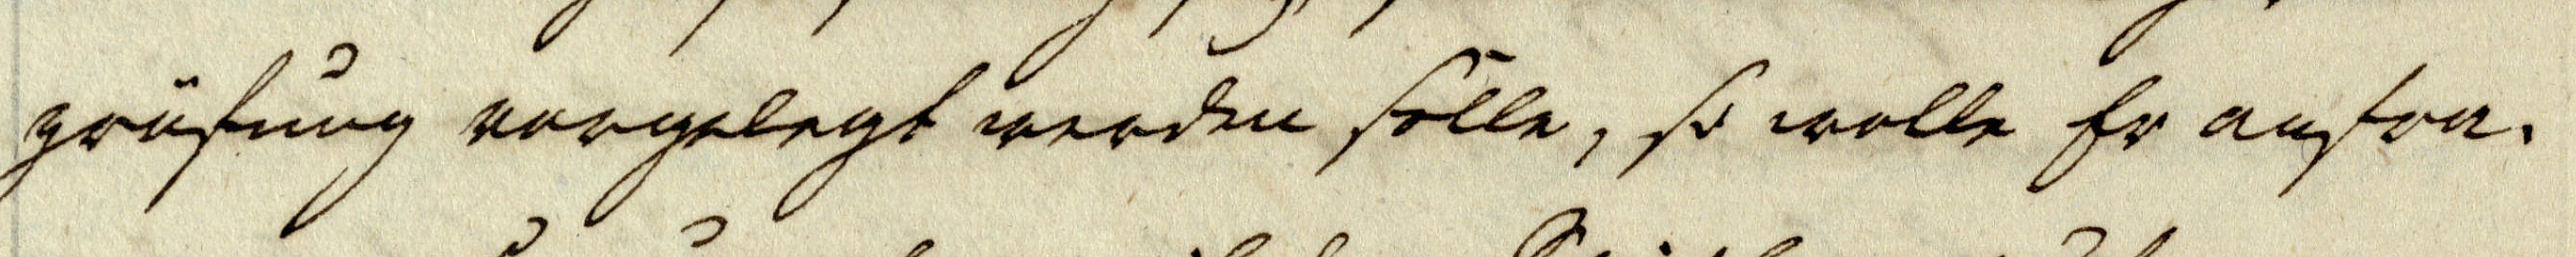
prüfung vorgelegt werden solle, so wolle Er anfra¬
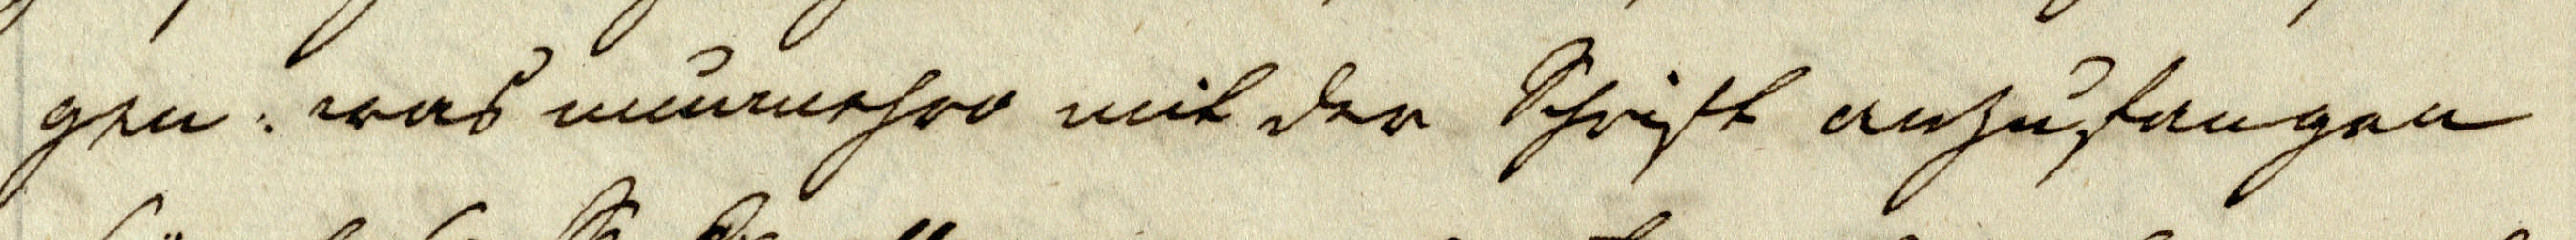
gen: was nunmehro mit der Schrift anzufangen
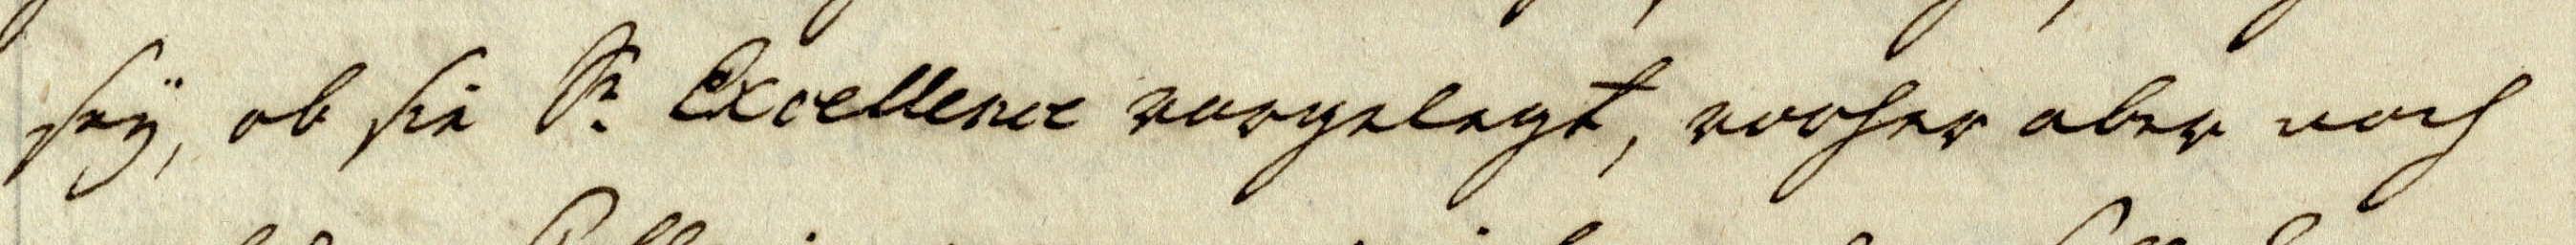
seÿ, ob sie Sr. Excellence vorgelegt, vorher aber noch
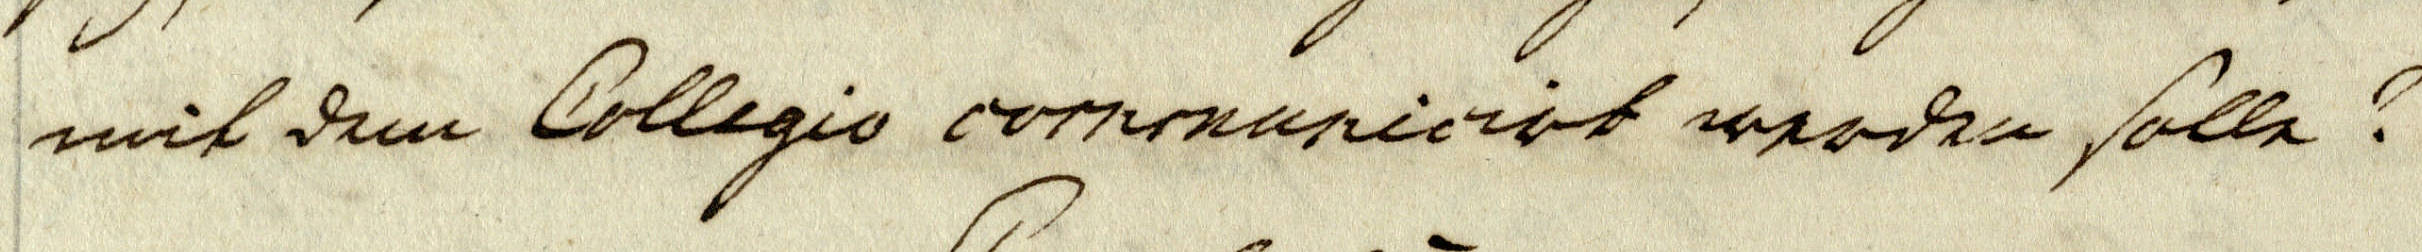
mit dem Collegio communicirt werden solle?
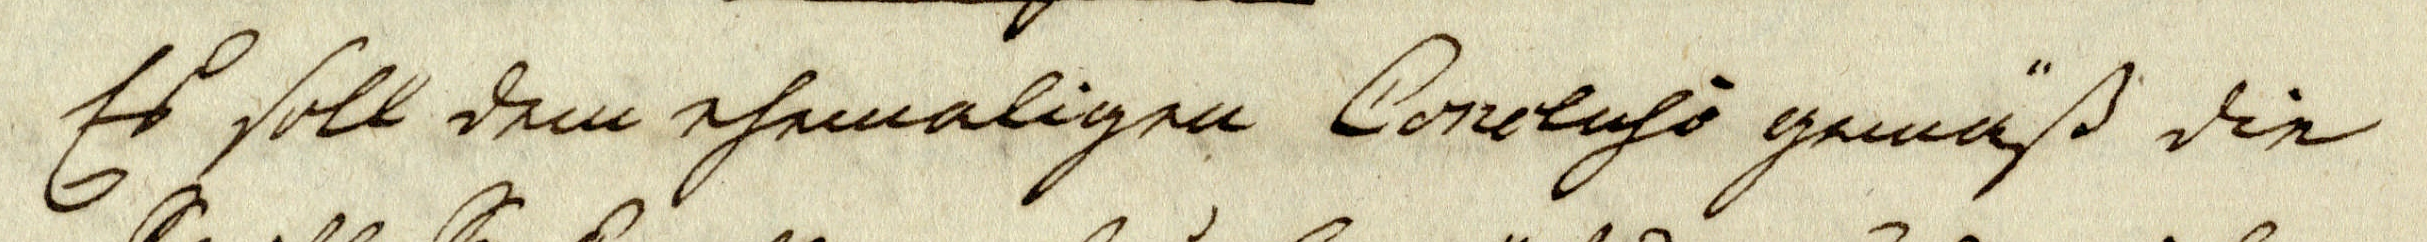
Es soll dem ehemaligen Concluso gemäß die
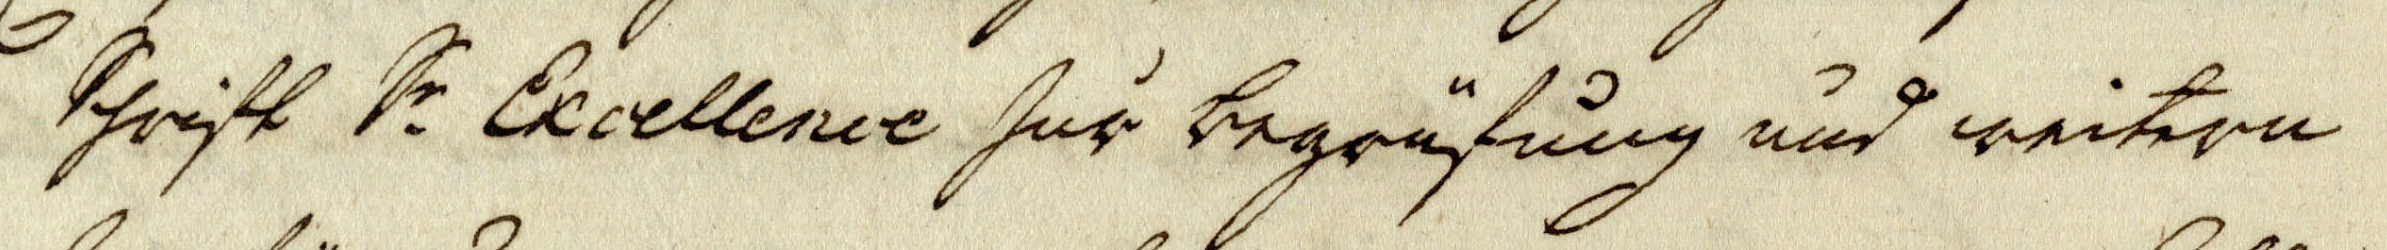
Schrift Sr Excellence zur Beprüfung und weitern
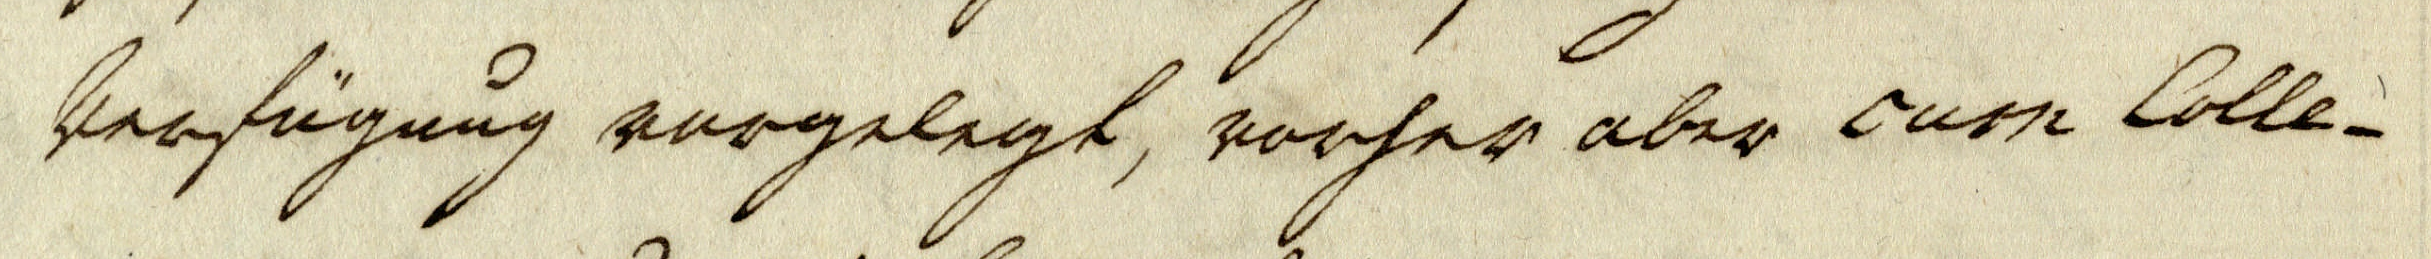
Verfügung vorgelegt, vorher aber cum Colle¬
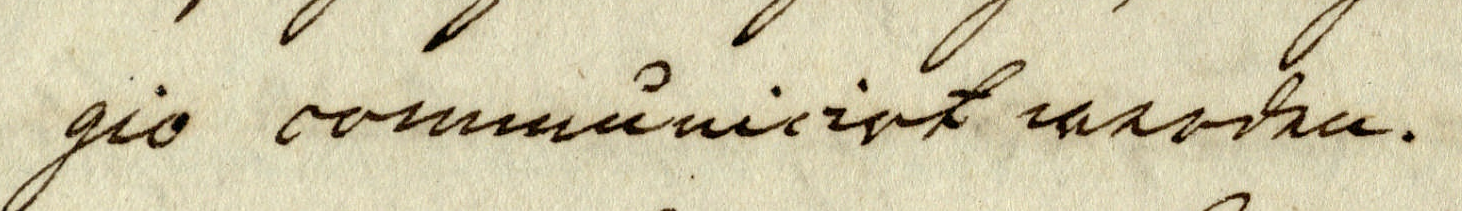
gio communicirt werden.
